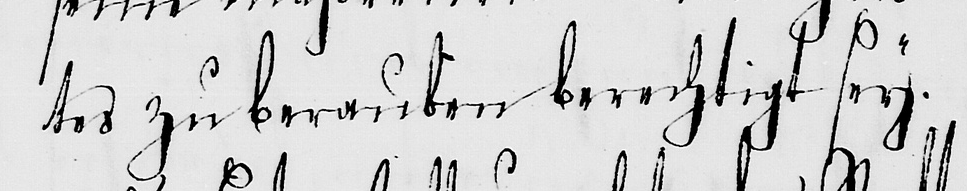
tes zu berauben berechtigt sey.
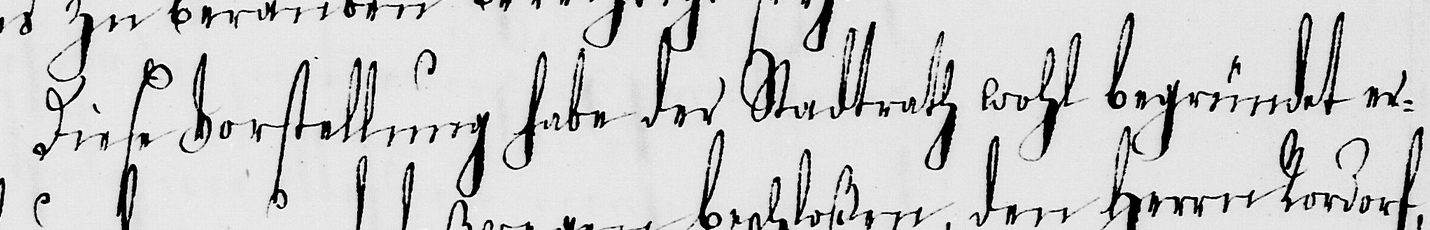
Diese Vorstellung habe der Stadtrath wohl begründet er¬
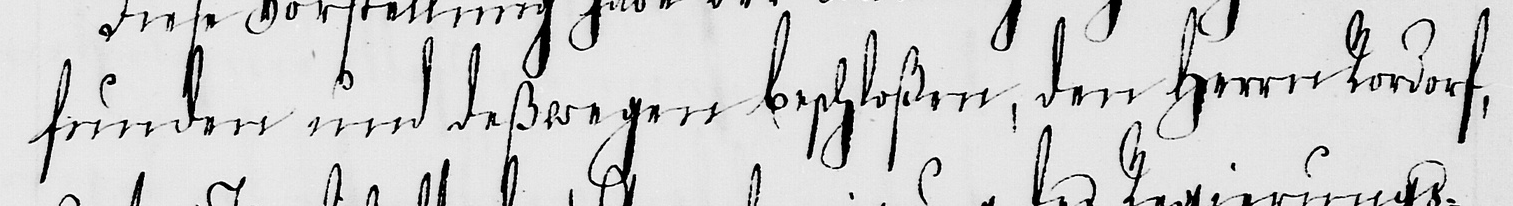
funden und deßwegen beschloßen, den Herrn Rordorf,
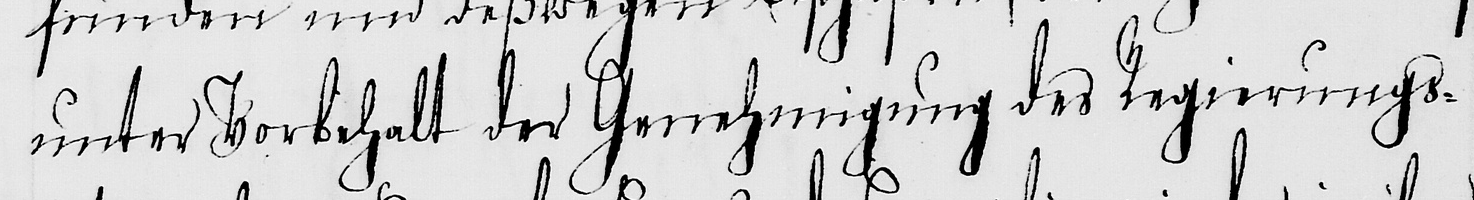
unter Vorbehalt der Genehmigung des Regierungs¬
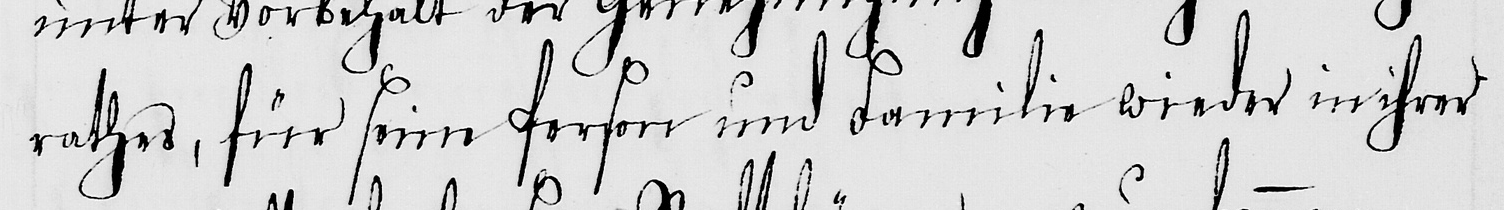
rathes, für seine Person und Familie wieder in ihrer
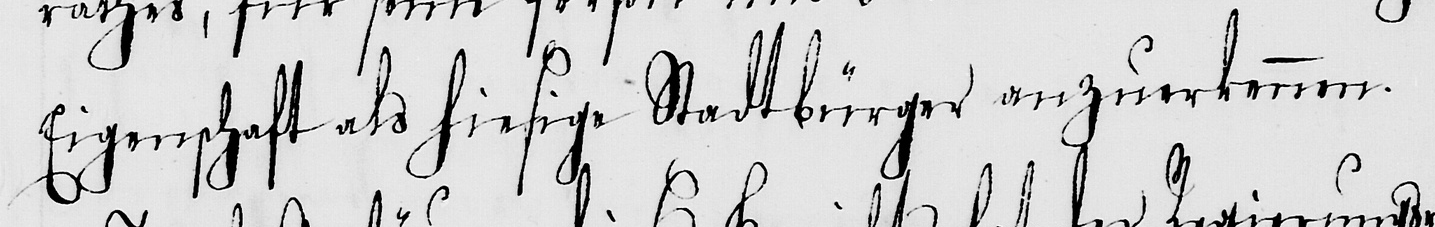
Eigenschaft als hiesige Stadtbürger anzuerkennen.
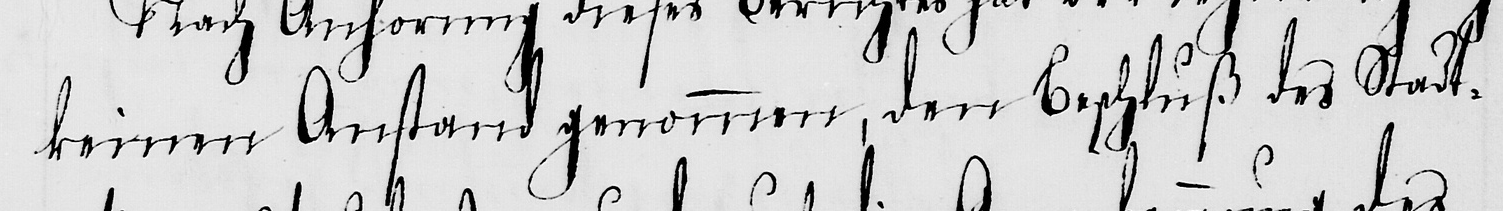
keinen Anstand genommen, den Beschluß des Stadt¬
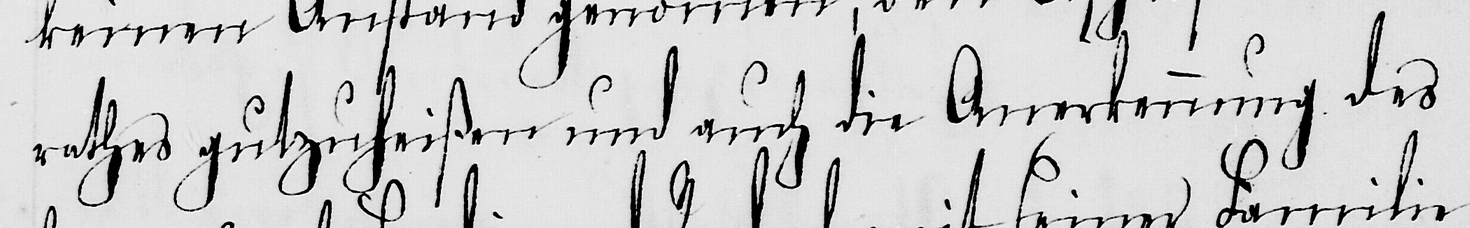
rathes gutzuheißen und auch die Anerkennung des
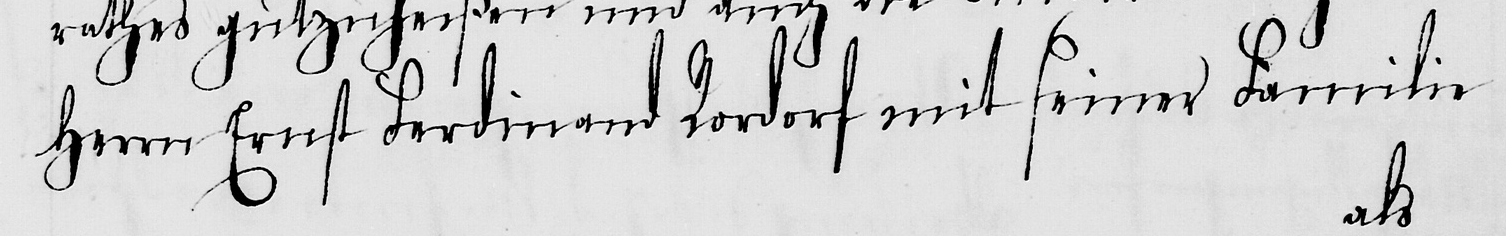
Herrn Ernst Ferdinand Rordorf mit seiner Familie
